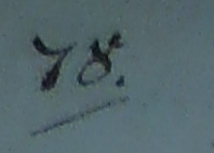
78.
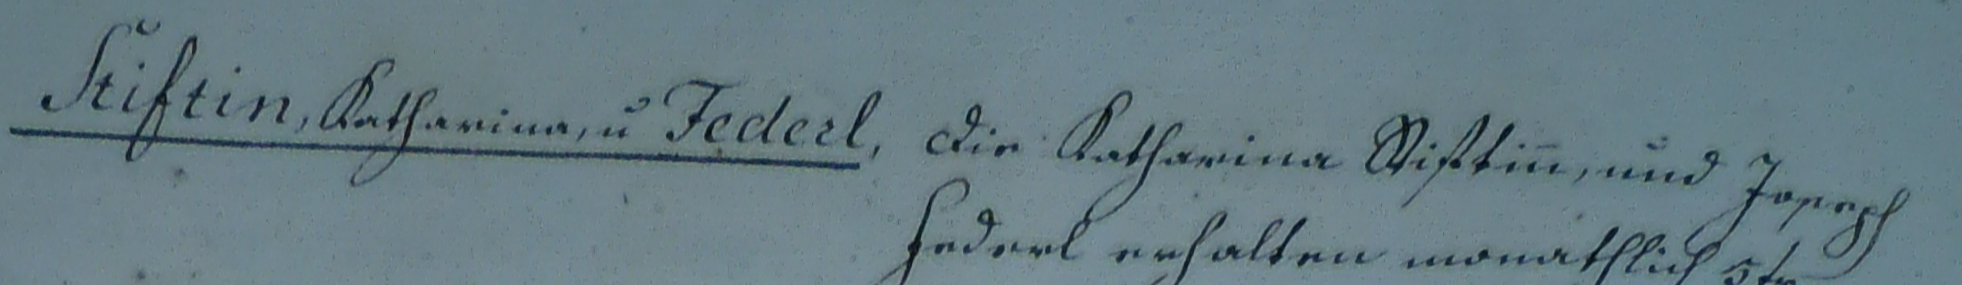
Stiftin, Katharina, u Federl, Die Katharina Stiftin̅, und Joseph
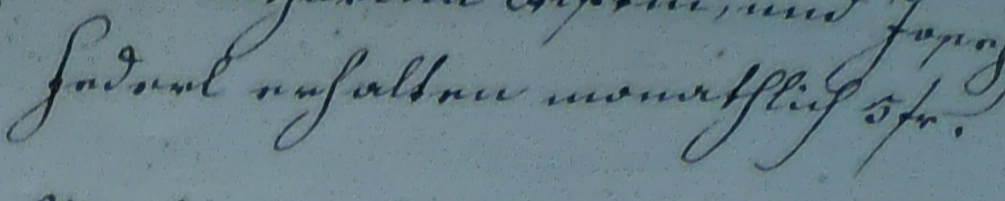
Federl ehalten monathlich 5fr.
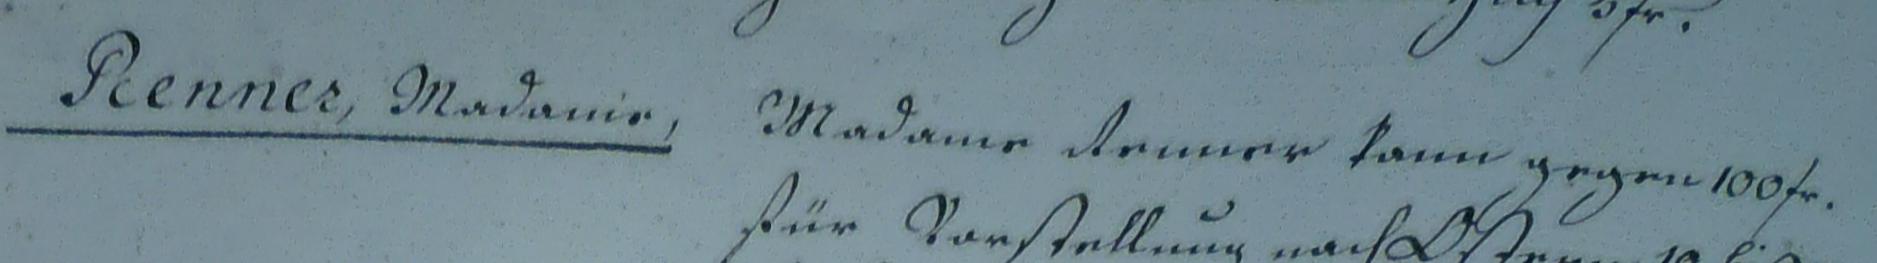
Renner, Madame, Madame Renner kann gegen 100fr.
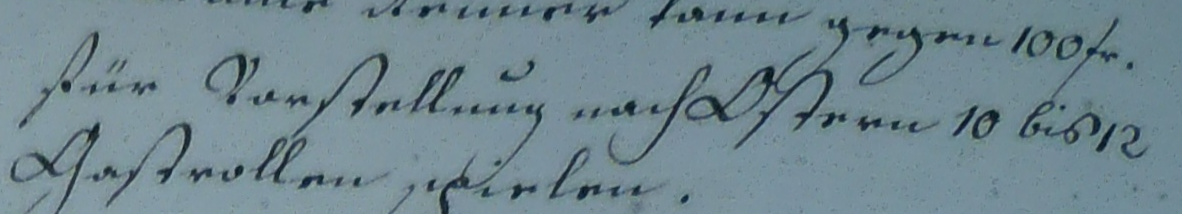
für Vorstellung nach Ostern 10 bis 12
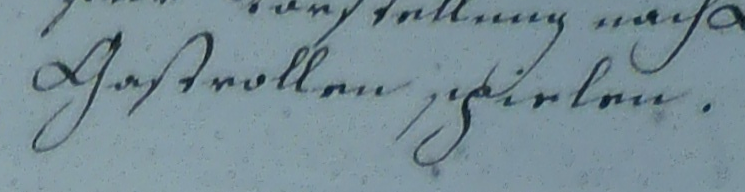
Gastrollen spielen.
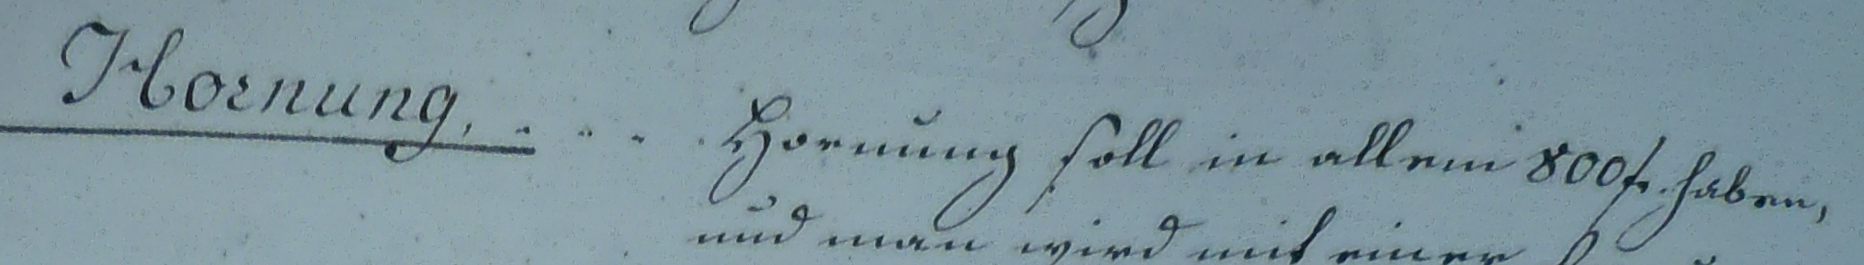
Hornung. .. .. .. Hornung soll in allem 800fr. haben,
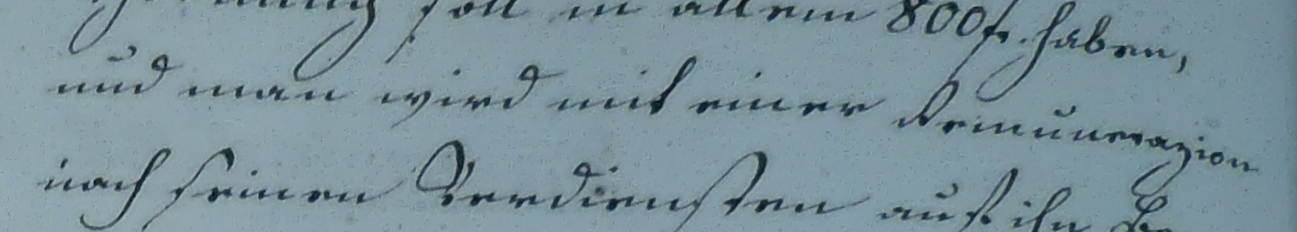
und man wird mit einer Remunerazion
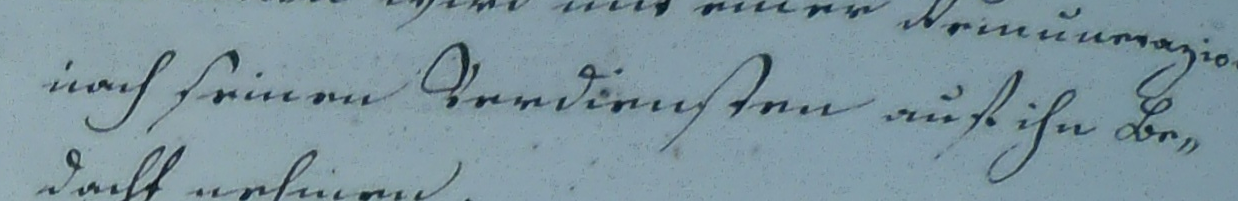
nach seinen Verdiensten auf ihn be¬
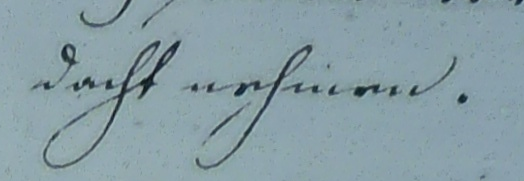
dacht nehmen.
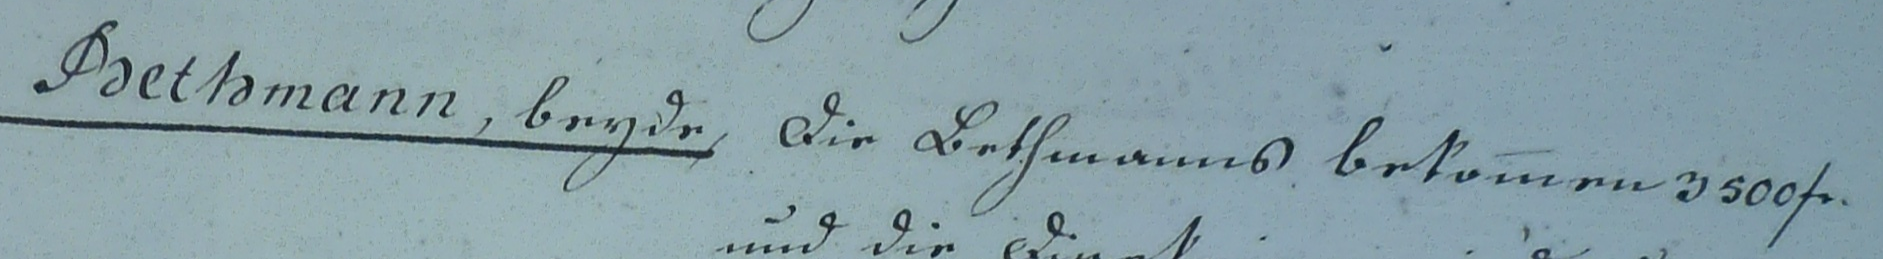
Bethmann, beyde, Die Bethmanns bekom̅en 3500fr.
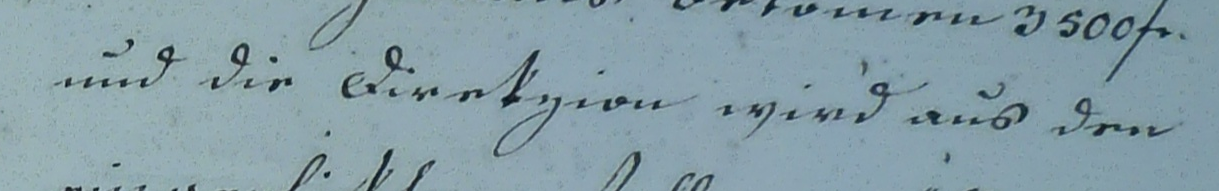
und die Direkzion wird aus den
